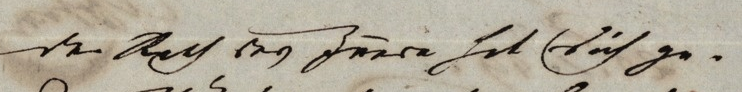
Der Rath des Innern hat dich ge-
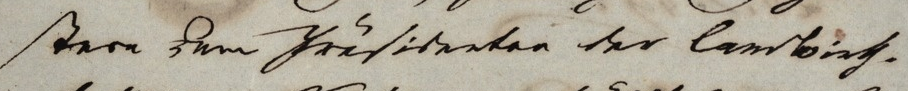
stern zum Präsidenten der landwirth-
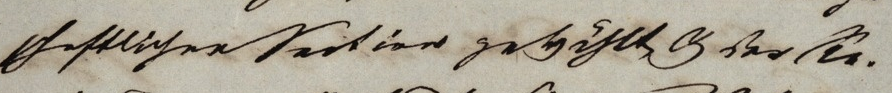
schaftlichen Section gewählt & der Re-
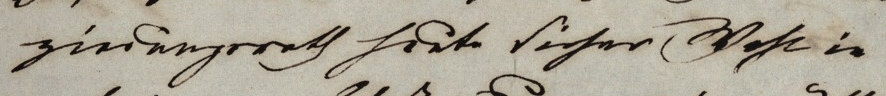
gierungsrath heute dieser Wahl in
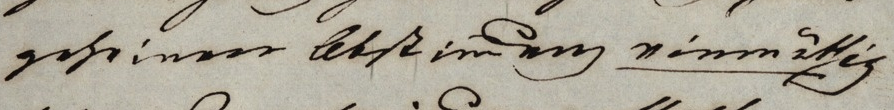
geheimer Abstimmung einmüthig
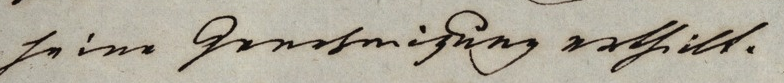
seine Genehmigung ertheilt.
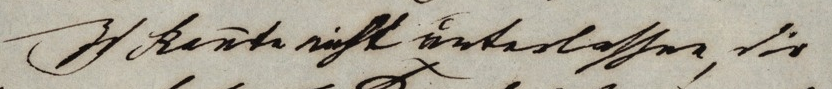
Ich konnte nicht unterlassen, dir
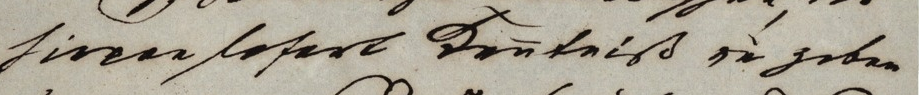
hievon sofort Kenntniß zu geben
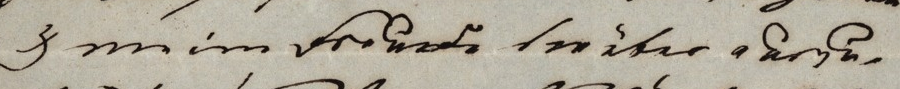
& meine Freude darüber auszu-
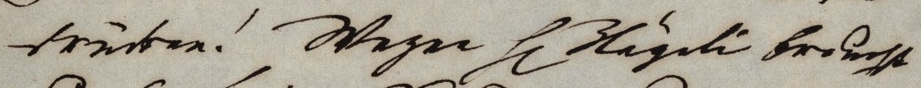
drücken! Wegen H Nägeli brauchst
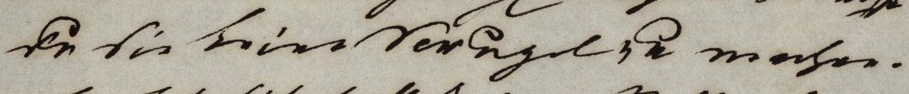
Du dir keine Scrupel zu machen.
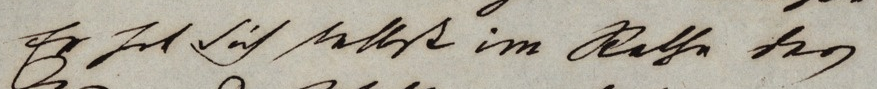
Er hat dich selbst im Rathe des
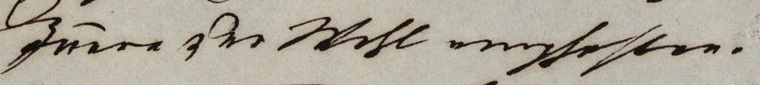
Innern zur Wahl empfohlen.
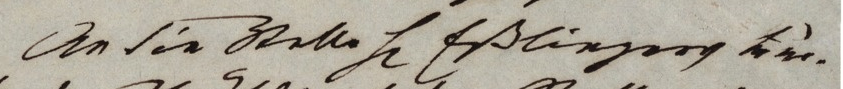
An die Stelle H Eßlingers wur-
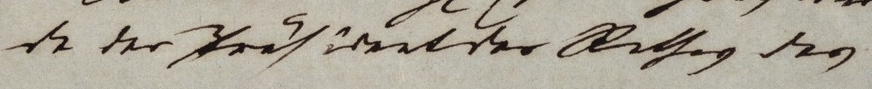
de der Präsident des Rathes des
